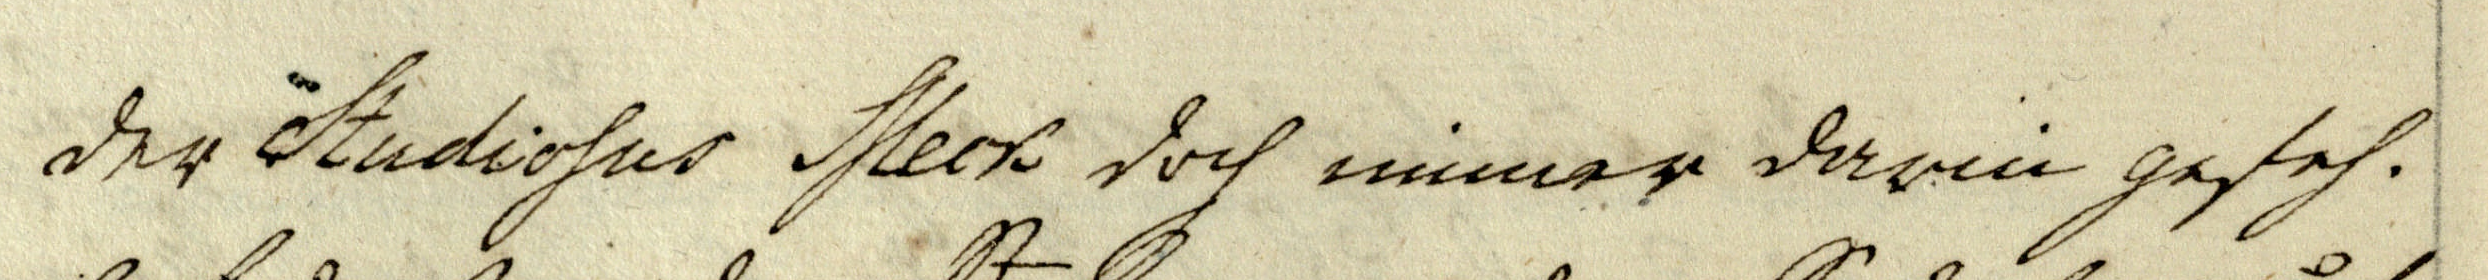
der Studiosus Meck doch immer darin gefeh¬
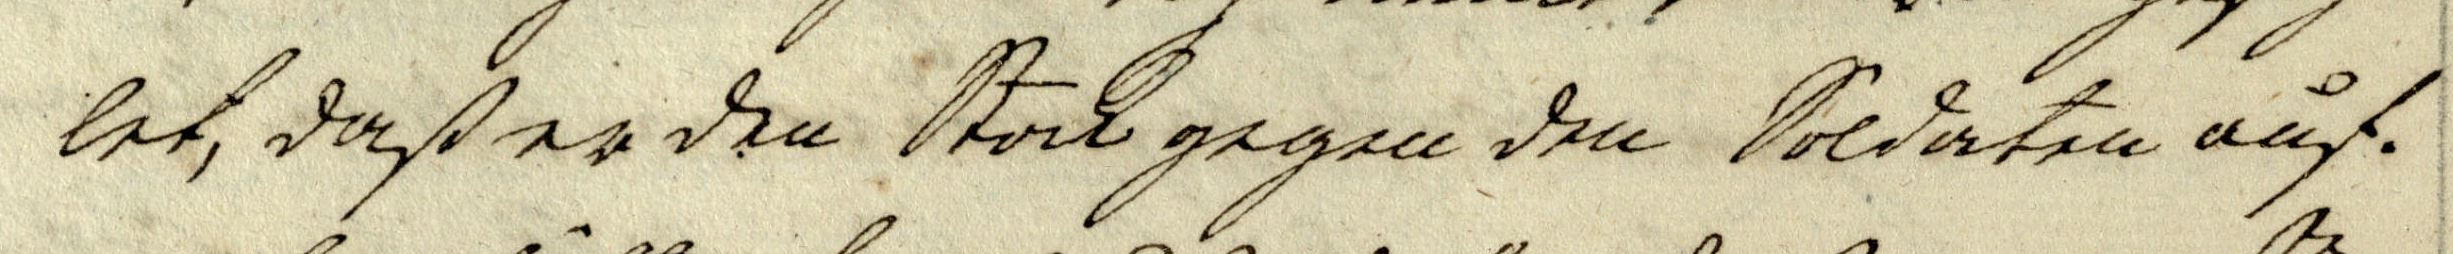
let, daß er den Stock gegen den Soldaten auf¬
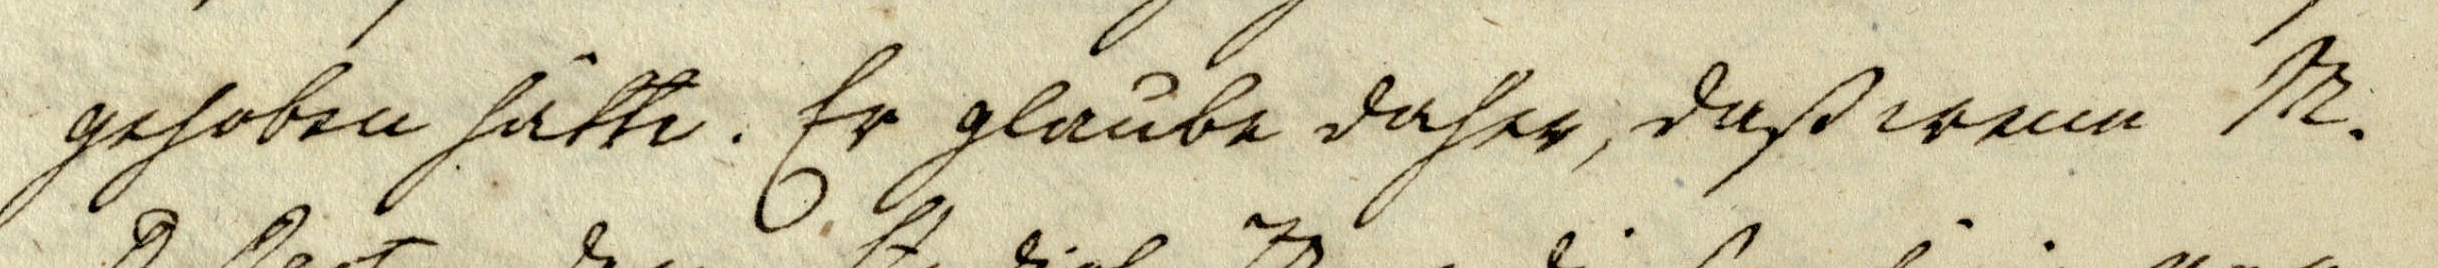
gehoben hätte. Er glaube daher, daß wenn M.
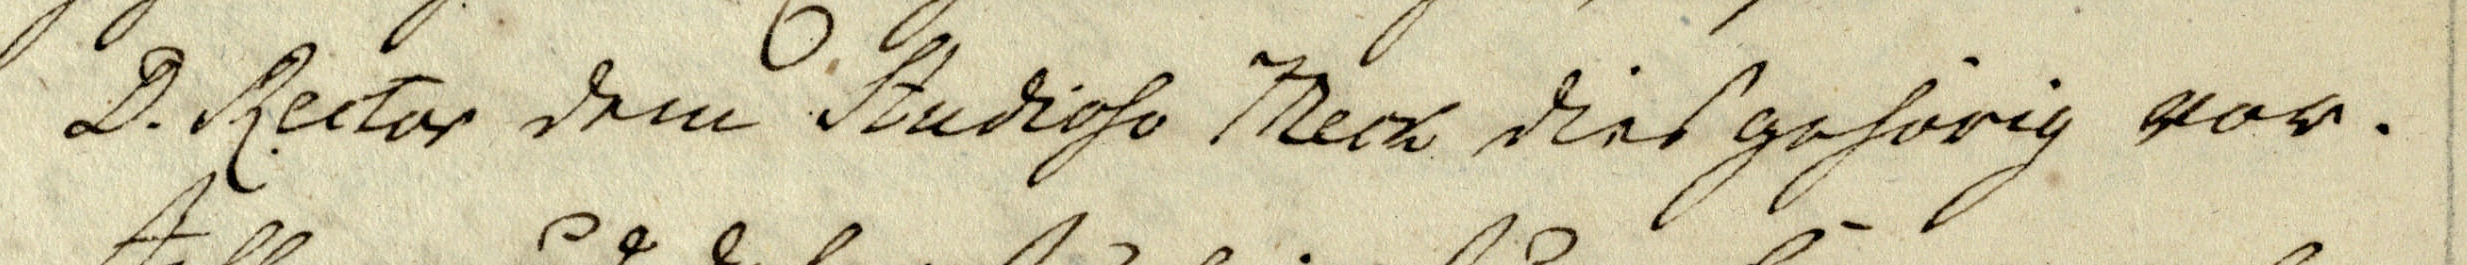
D. Rector dem Studioso Meck dies gehörig vor
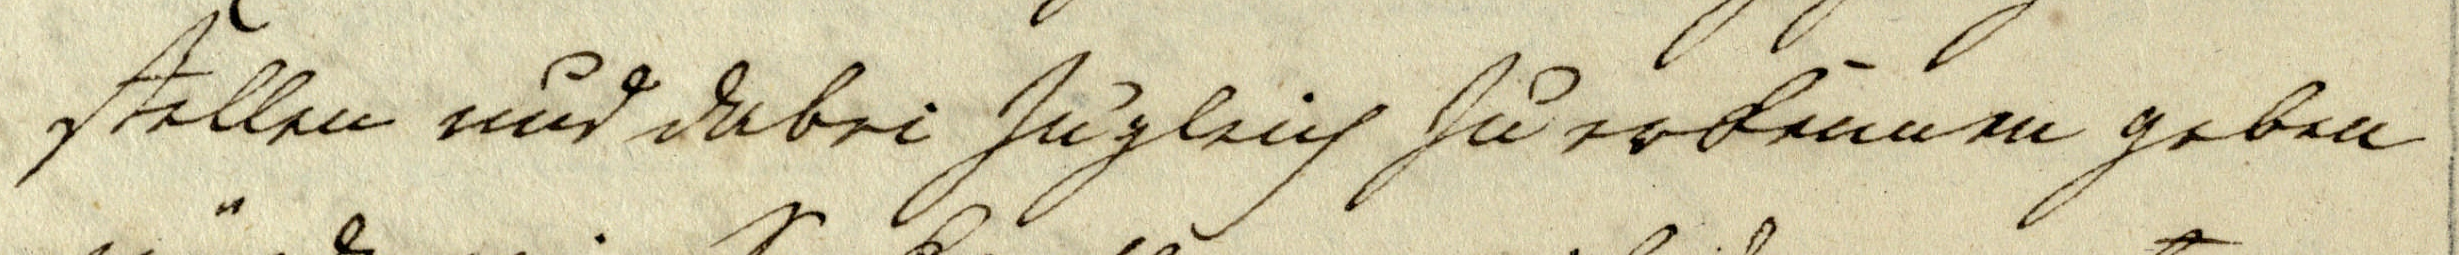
stellen und dabei zugleich zu erkennen geben
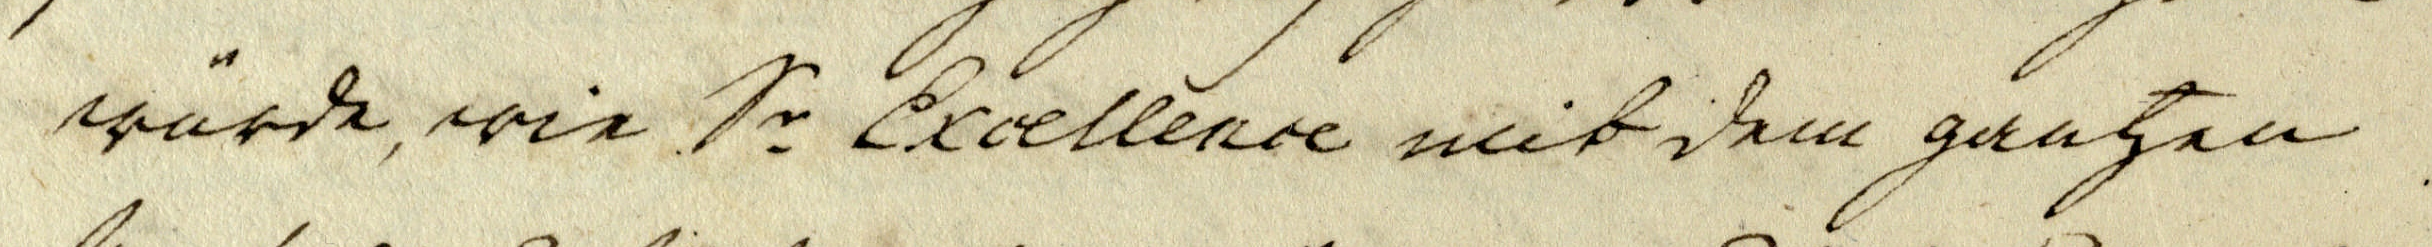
würde, wie Sr Excellence mit dem gantzen
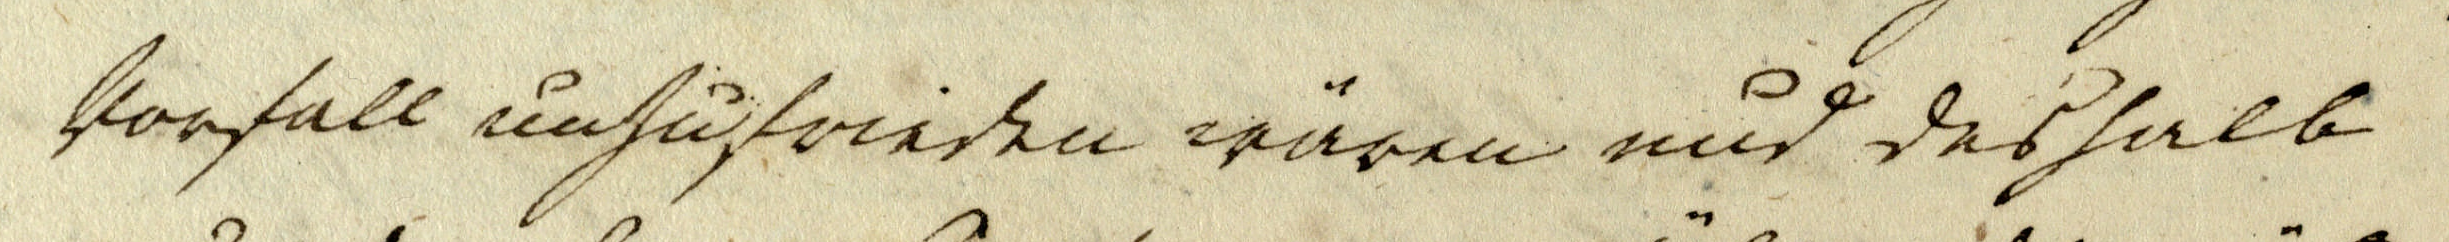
Vorfall unzufrieden wären und deshalb
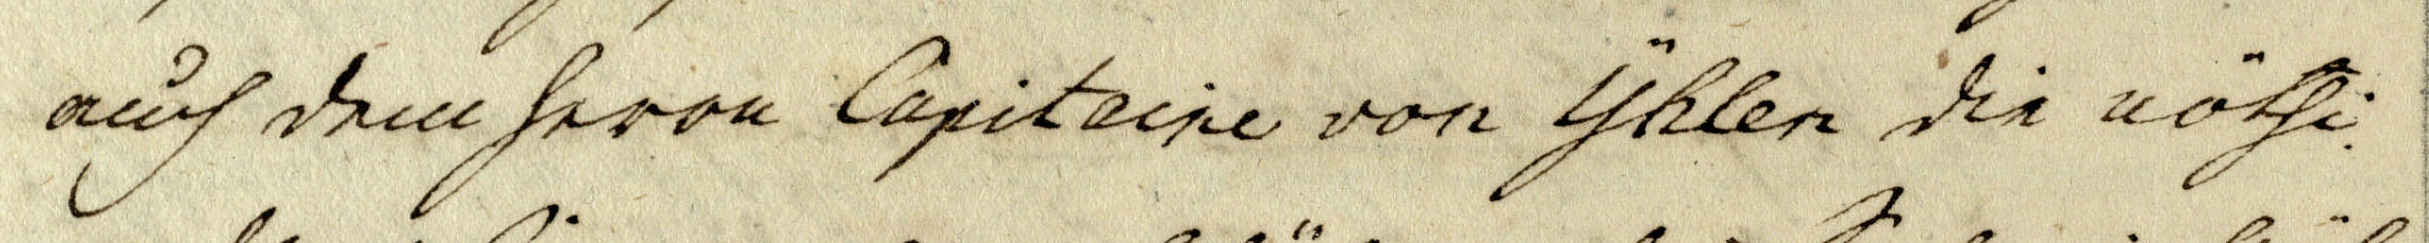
auch dem Herrn Capitaine von Ÿhlen die nöthi¬
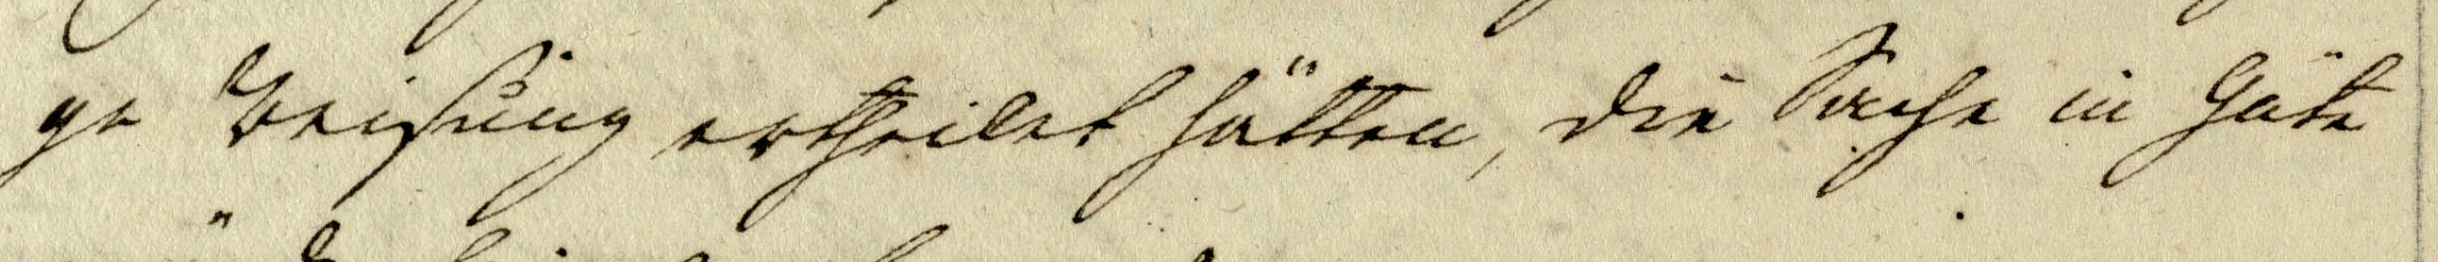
ge Weisung ertheilet hätten, die Sache in Güte
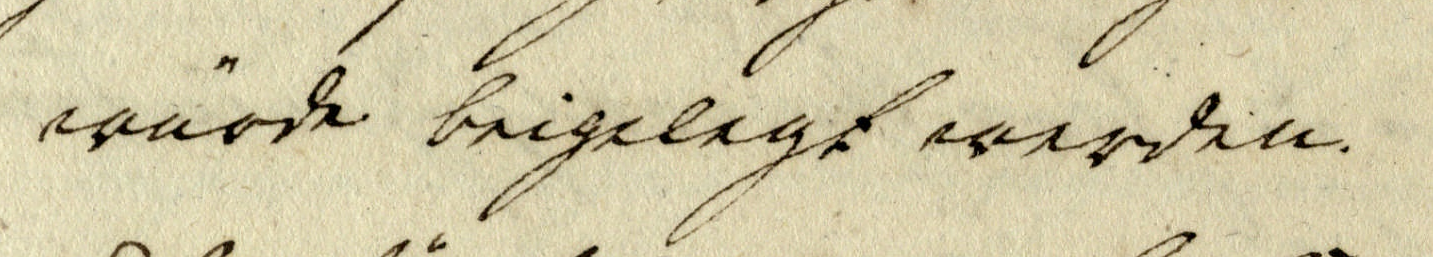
würde beigelegt werden.
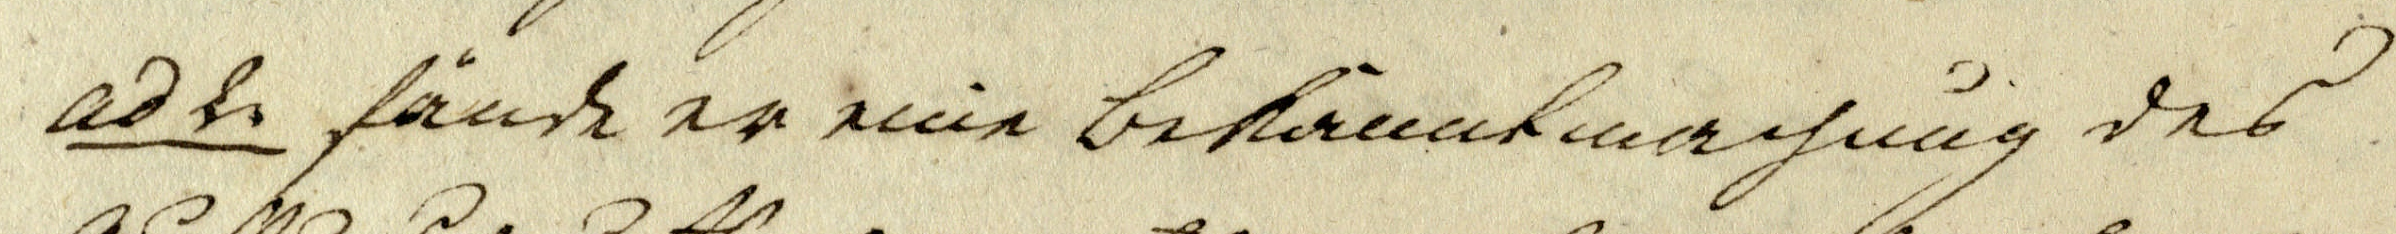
ad 2. fände er eine Bekanntmachung des
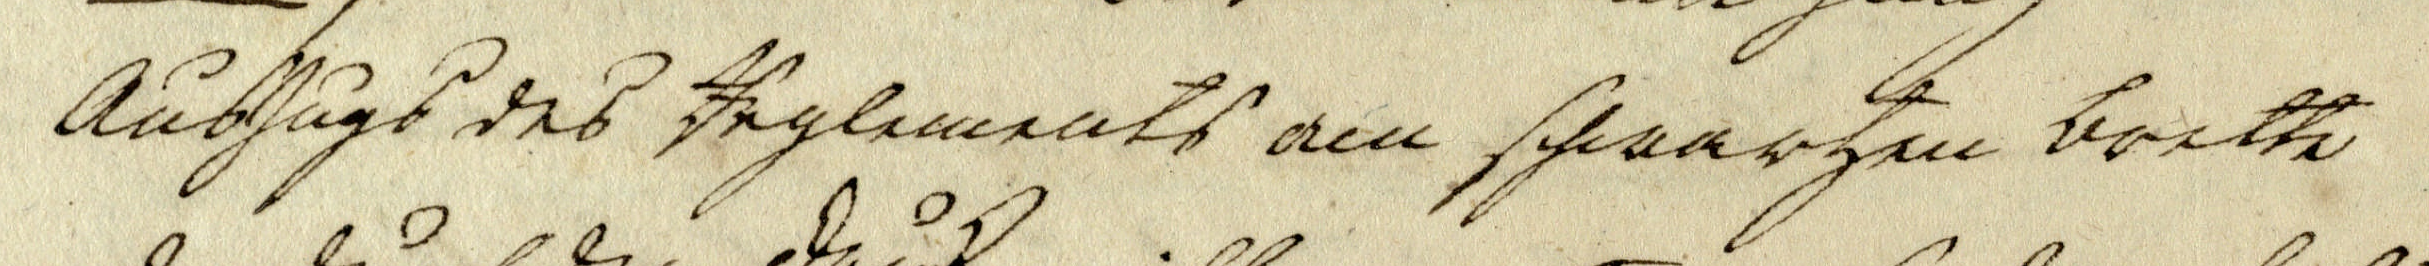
Auszugs des Reglements am schwarzen Brette
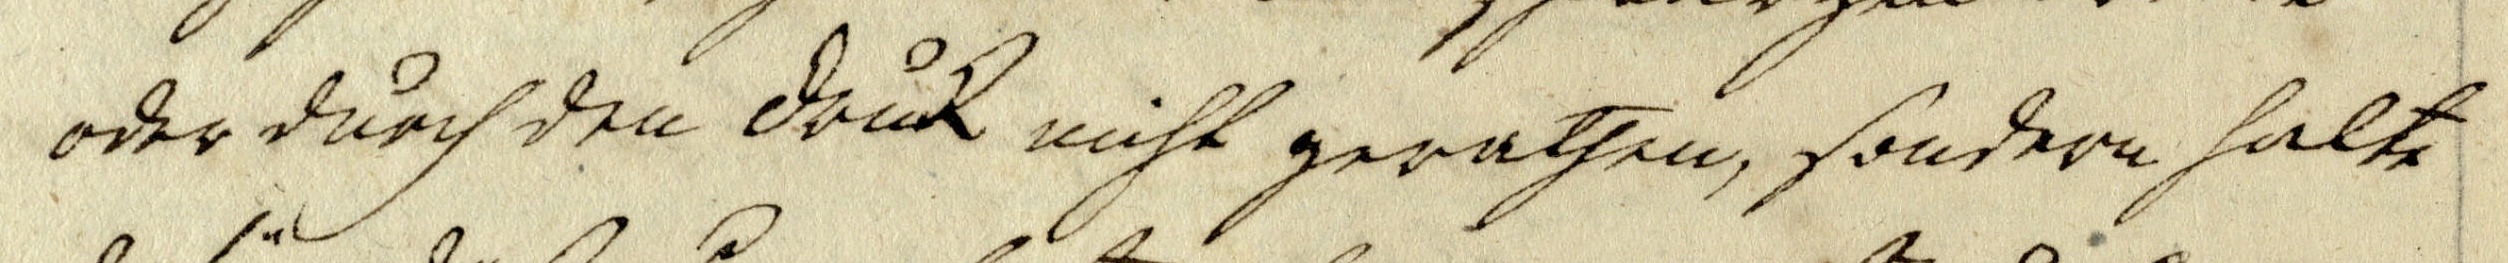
oder durch den Druck nicht gerathen, sondern halte
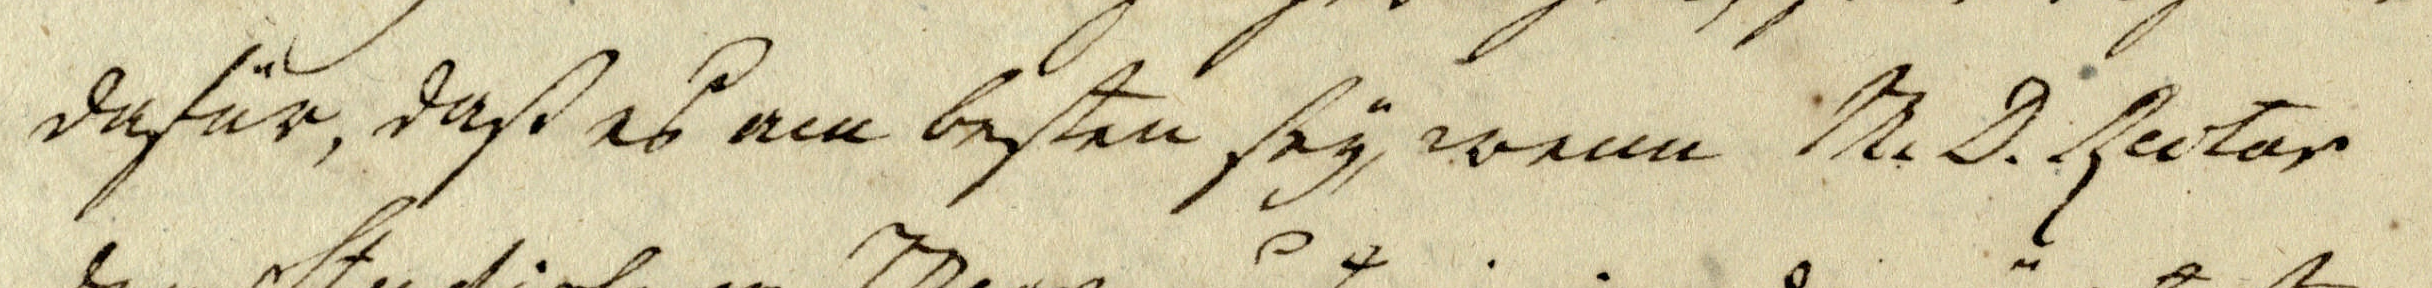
dafür, daß es am besten seÿ, wenn M. D. Rector
